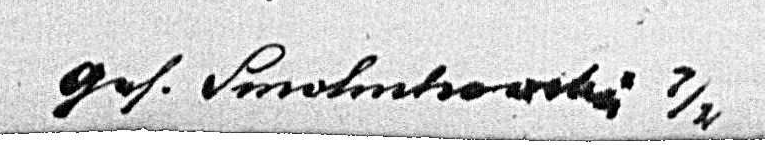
Grf Smolenkowski 7/2
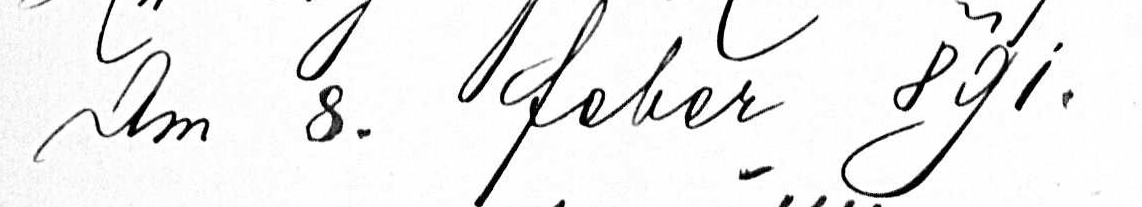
Am 8. Feber 1891
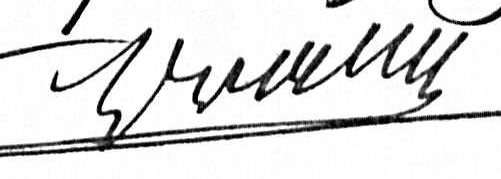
Wwany
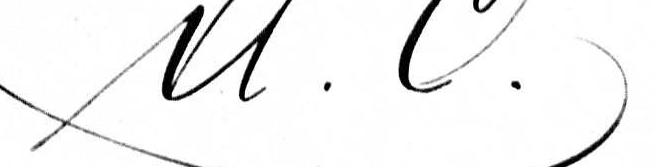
A E
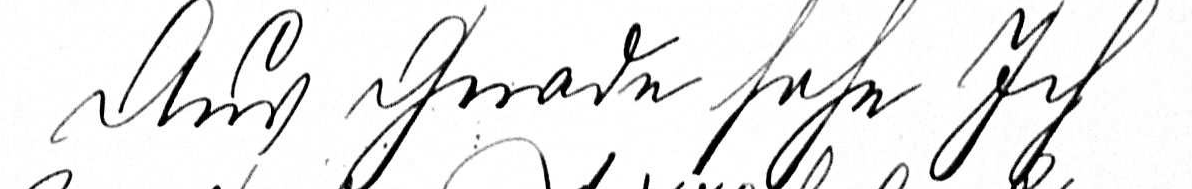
Aus Gnade sehe Ich
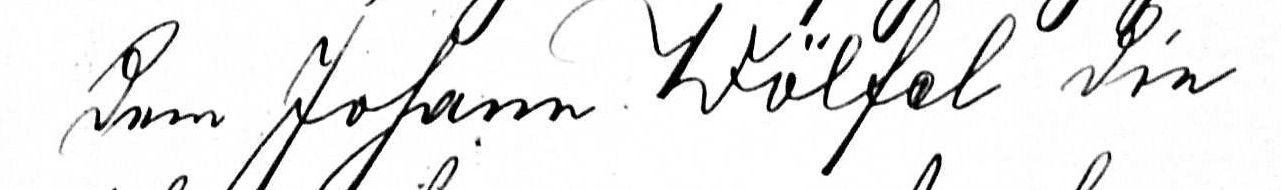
dem Johann Wölfel die
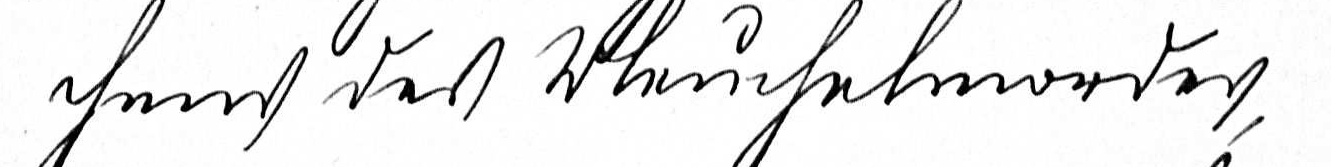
chens des Meuchelmordes,
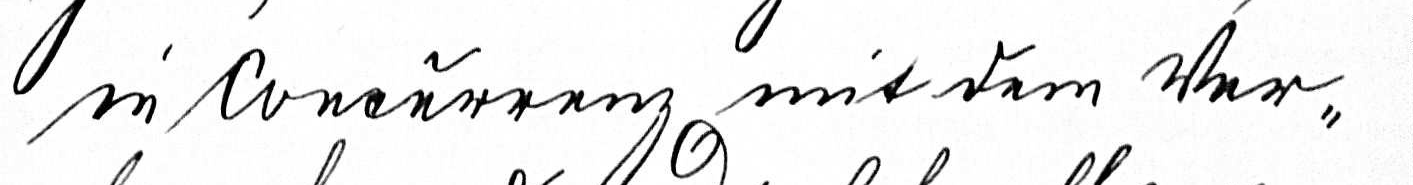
in Concurrenz mit dem Ver¬
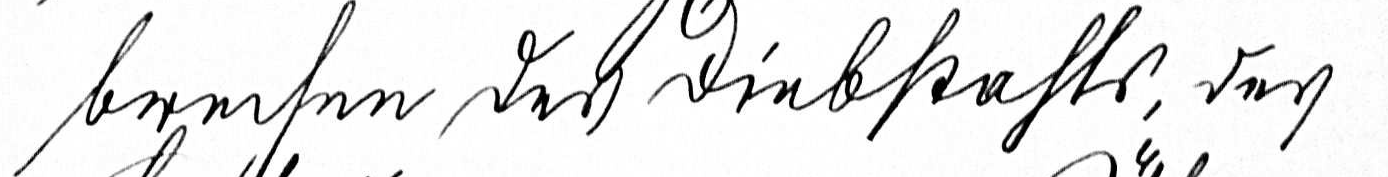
brechen des Diebstahls, des
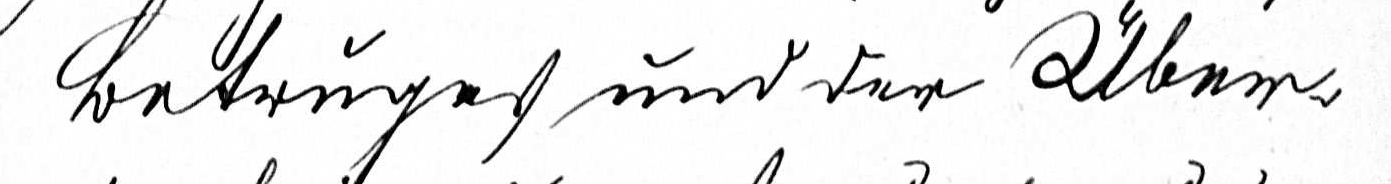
Betruges und der Über¬
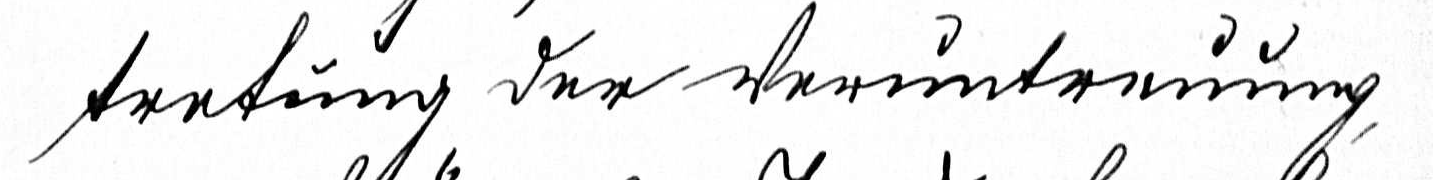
tretung der Veruntreuung
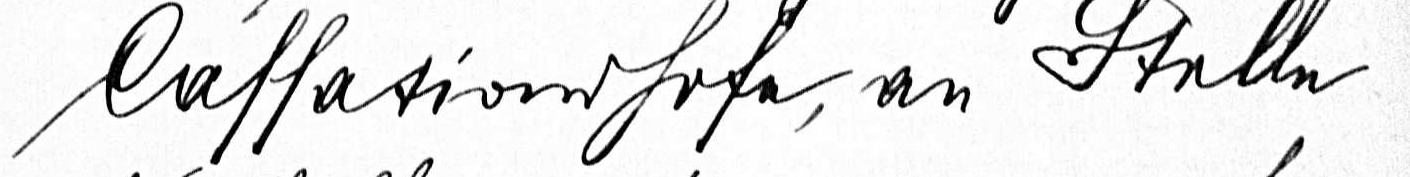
Cassationshofe, an Stelle
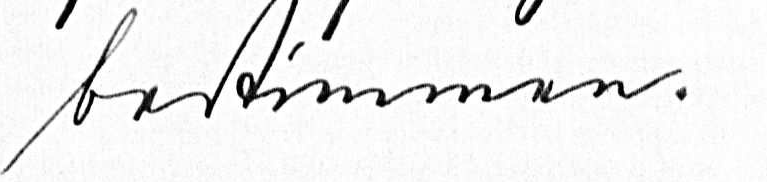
bestimmen.
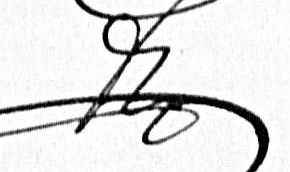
FJ
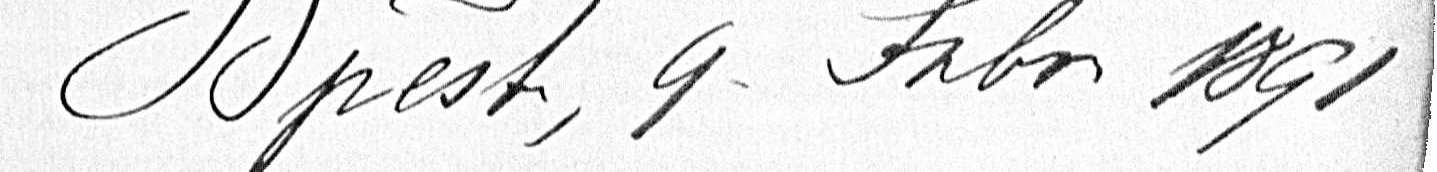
Bpest, 9 Febr 1891
